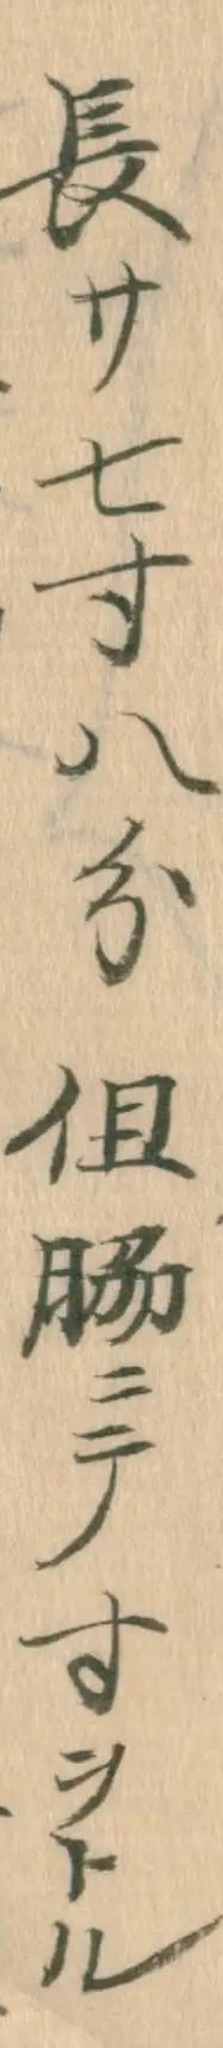長サ七寸八分但脇ニテ寸ヲトル
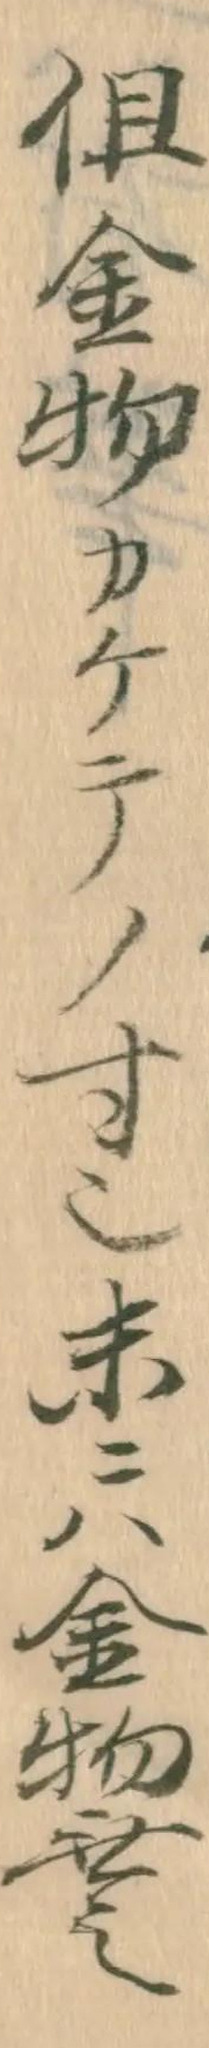但金物カケテノ寸也末ニハ金物無之
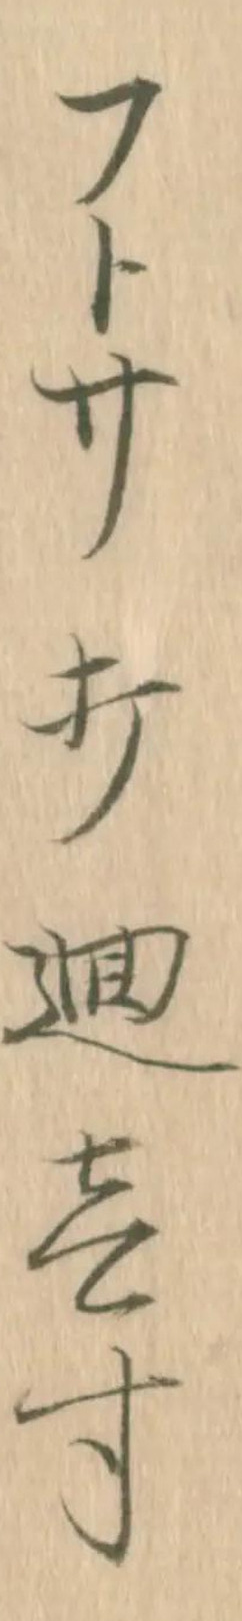フトサ打廻壱寸
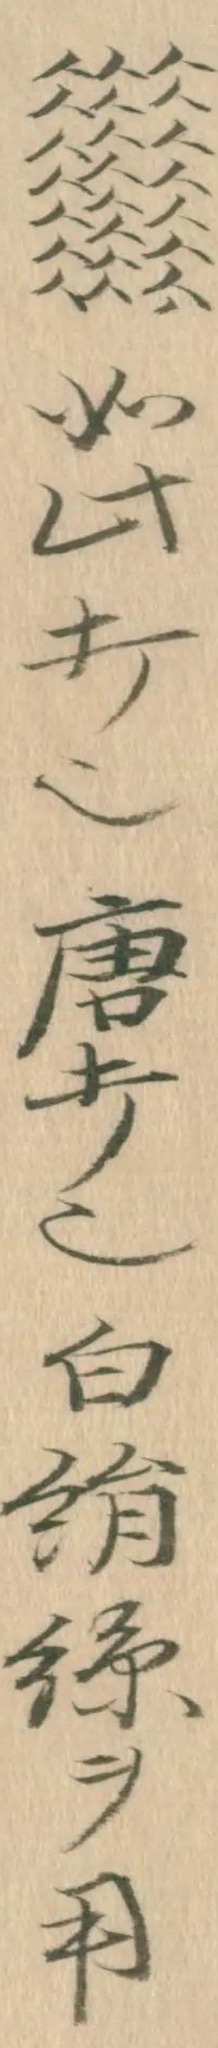如此打也唐打也白絹絲ヲ用
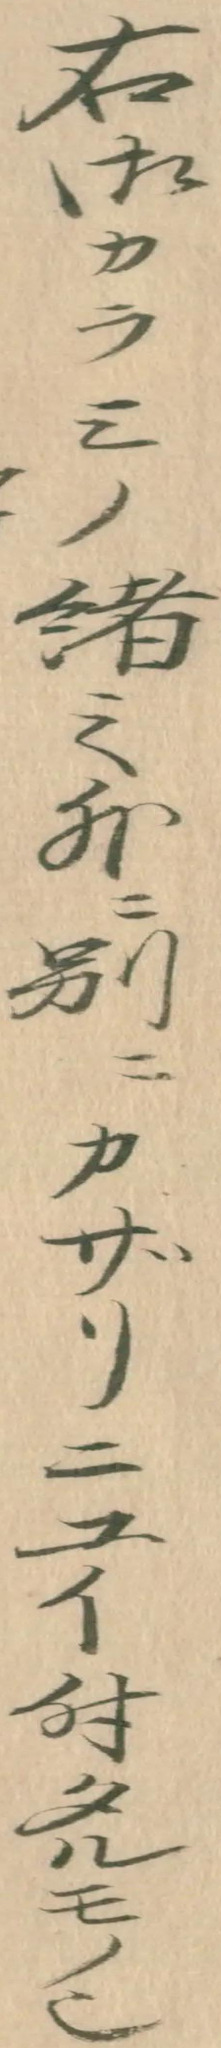右御カラミノ緒之外ニ別ニカザリニユイ付タルモノ也
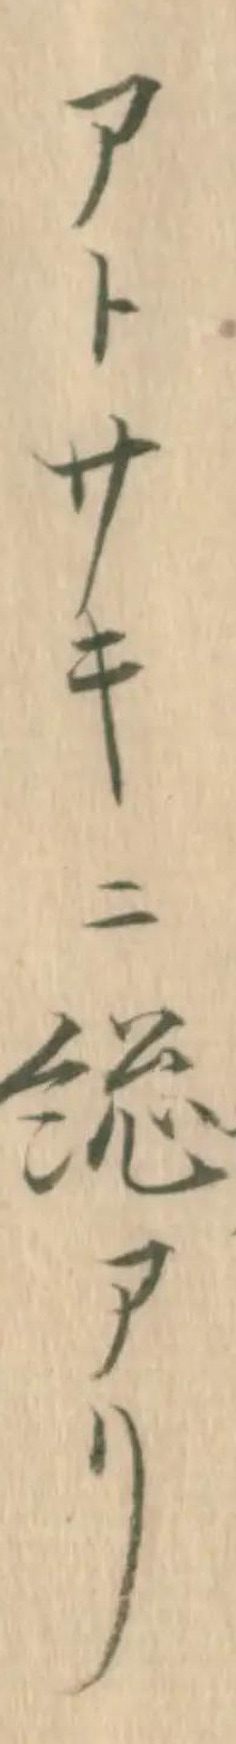アトサキニ総アリ
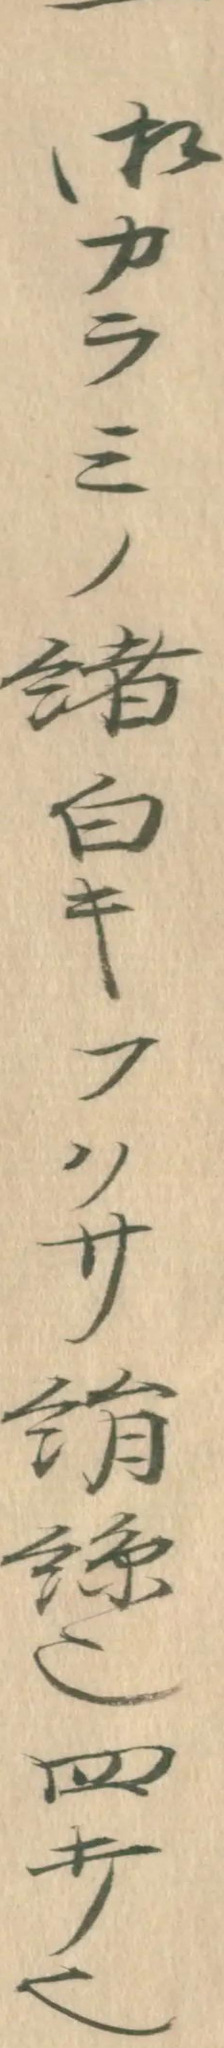一御カラミノ緒白キフクサ絹絲也四打也
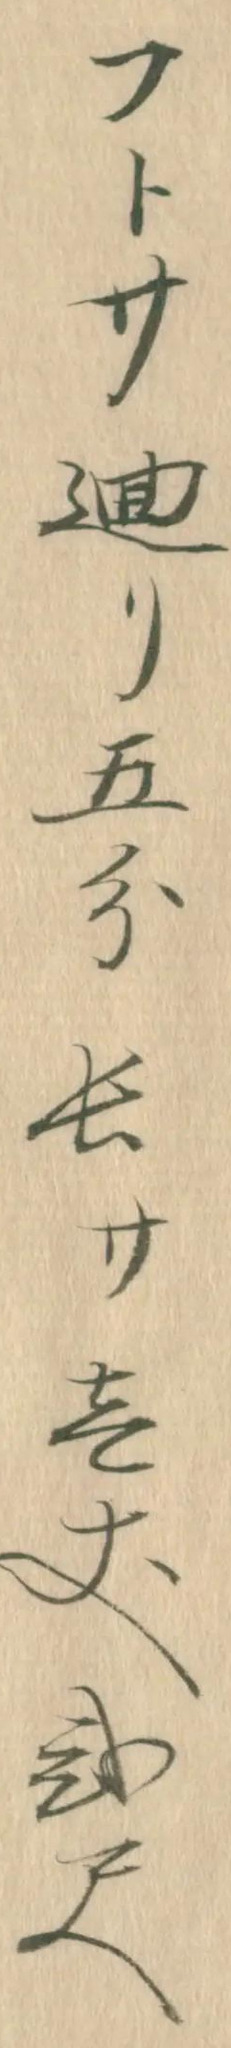フトサ廻リ五分長サ壱丈弐尺
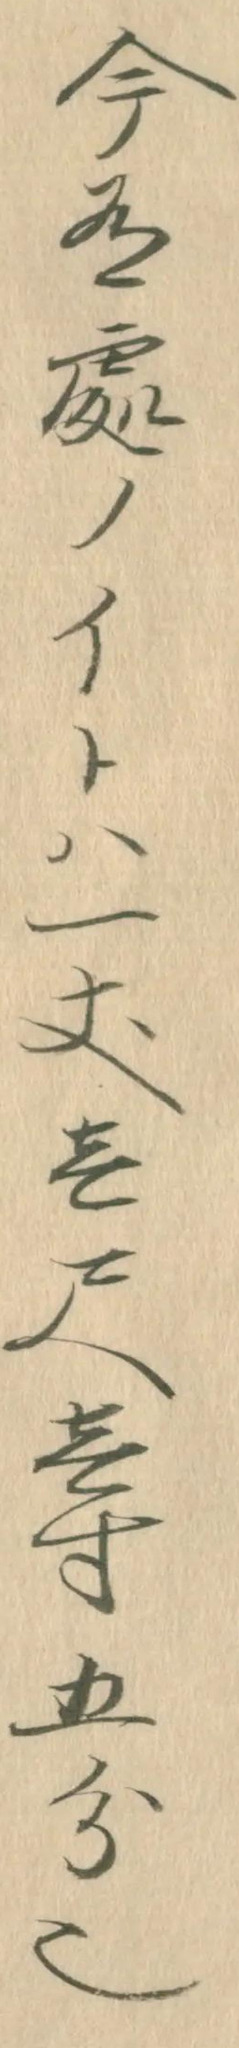今有処ノイトハ一丈壱尺壱寸五分也
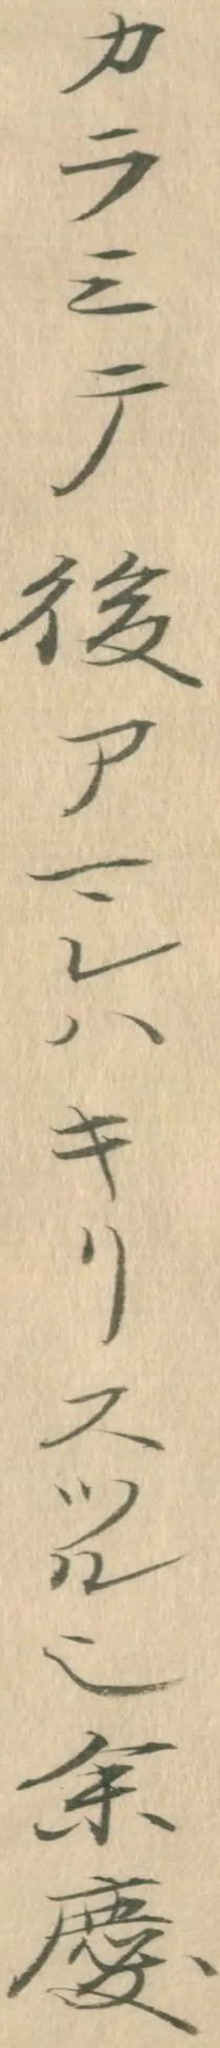カラミテ後アマレハキリスツル也余慶
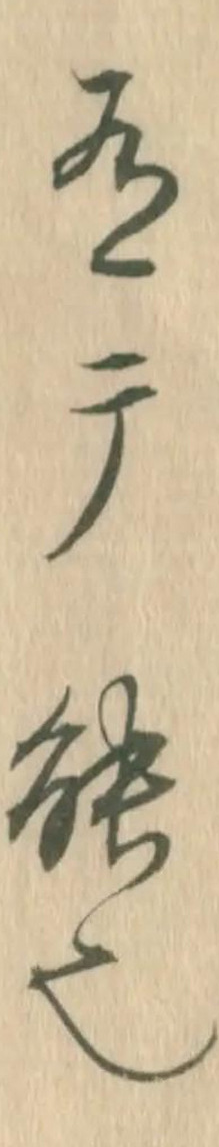有テ能也
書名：賀茂社記録. 第15冊
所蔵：国立国会図書館 National Diet Library, JAPAN
